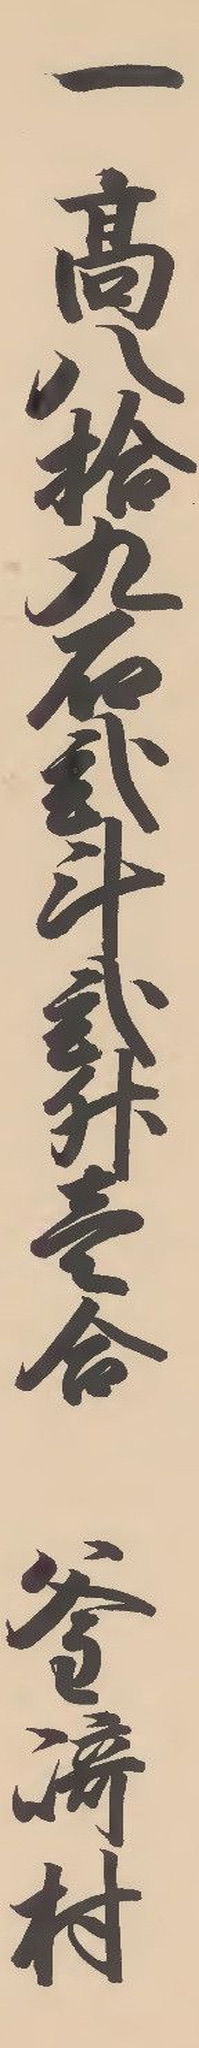一高八拾九石弐斗弐升壱合釜崎村
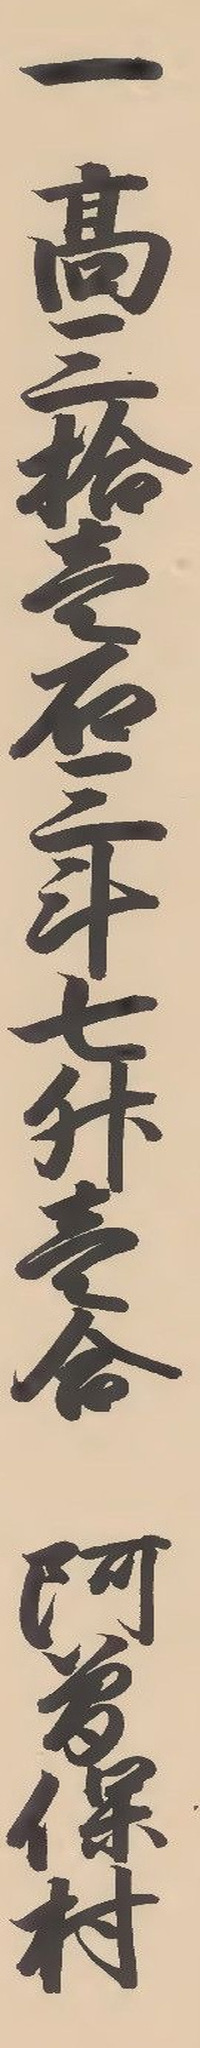一高三拾壱石三斗七升壱合阿曽保村
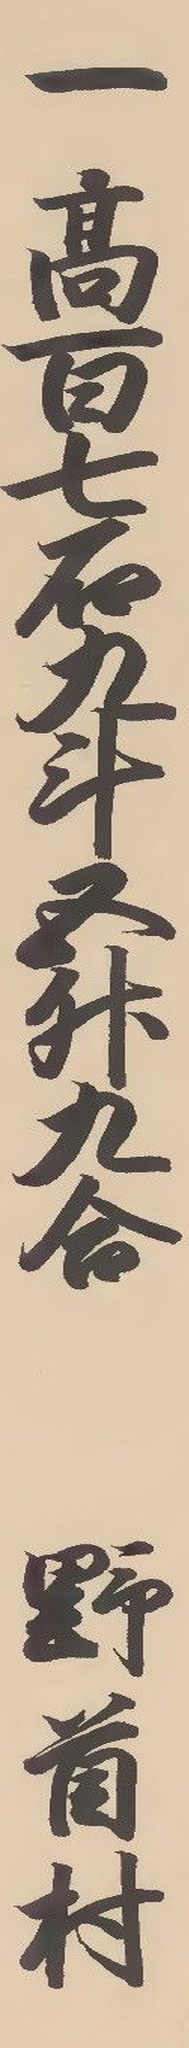一高百七石九斗五升九合野首村
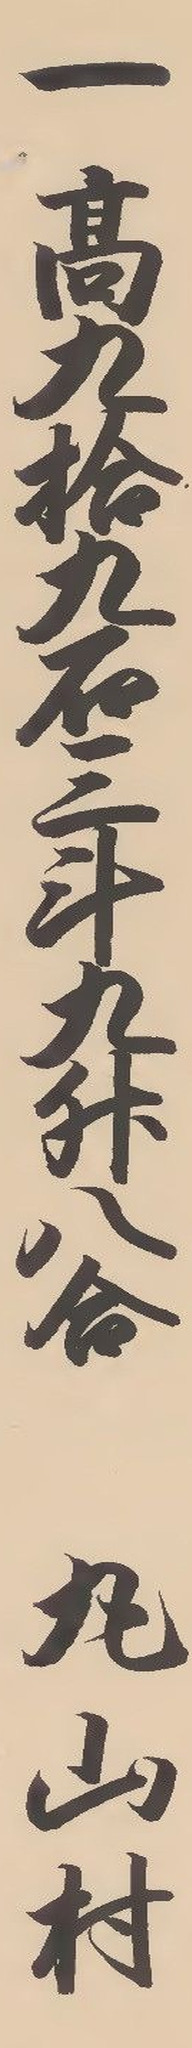一高九拾九石三斗九升八合丸山村
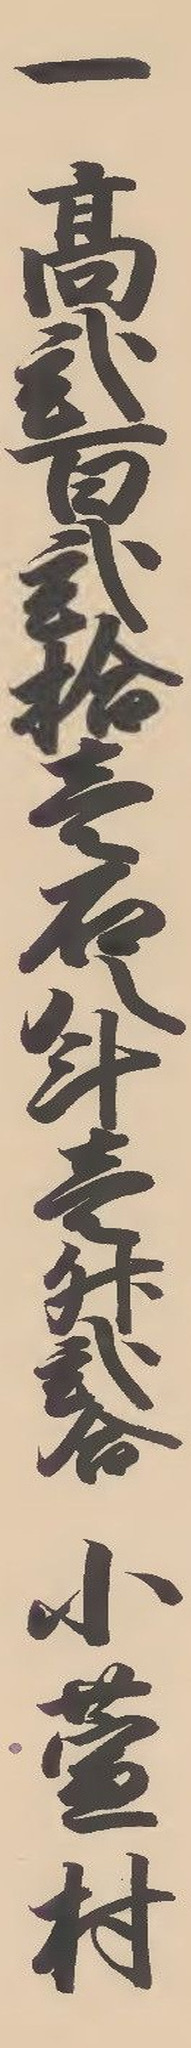一高弐百弐拾壱石八斗壱升弐合小萱村

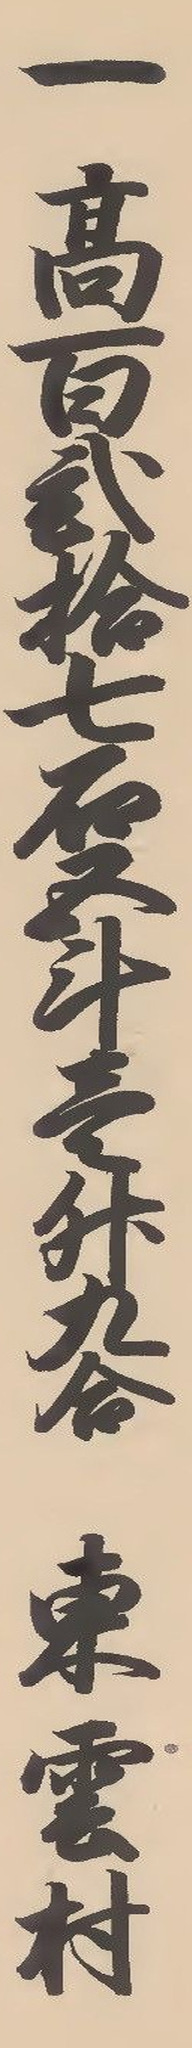一高百弐拾七石五斗壱升九合東雲村
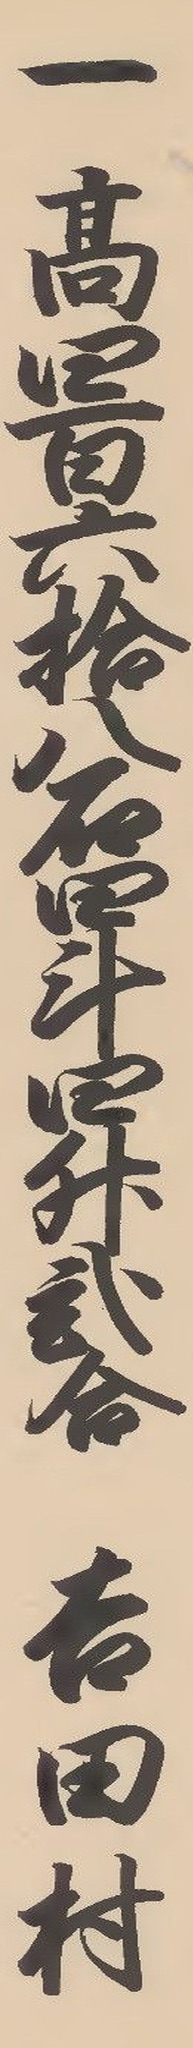一高四百六拾八石四斗四升弐合吉田村
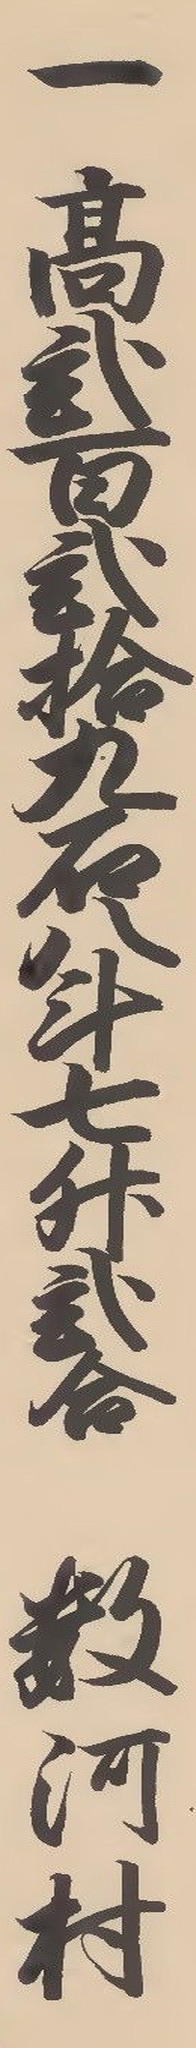一高弐百弐拾九石八斗七升弐合数河村
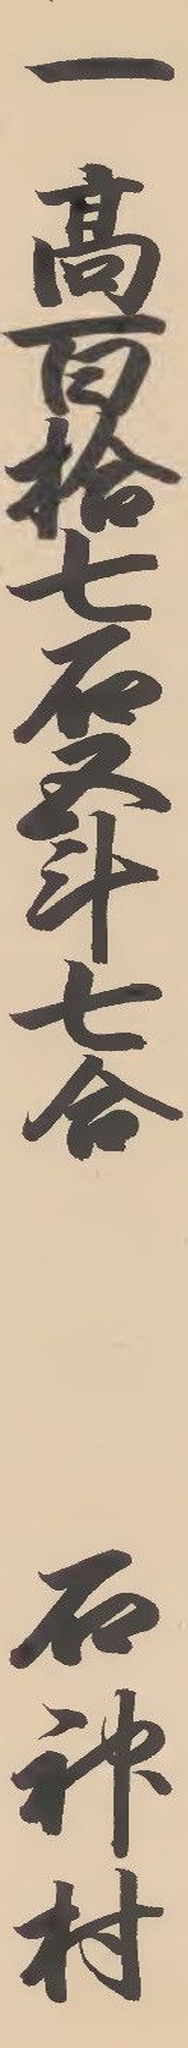一高百拾七石五斗七合石神村
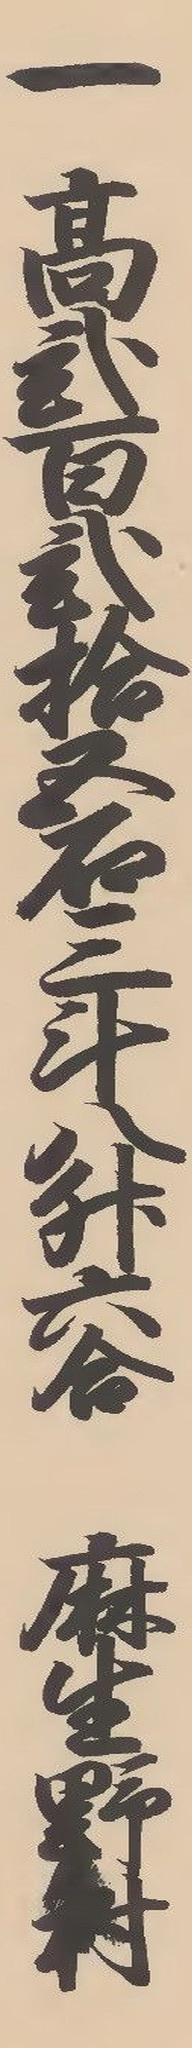一高弐百弐拾五石三斗八升六合麻生野村
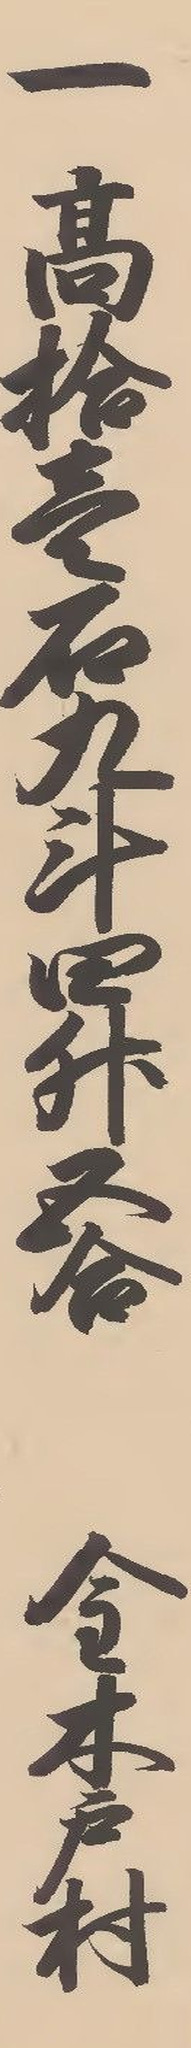一高拾壱石九斗四升五合金木戸村
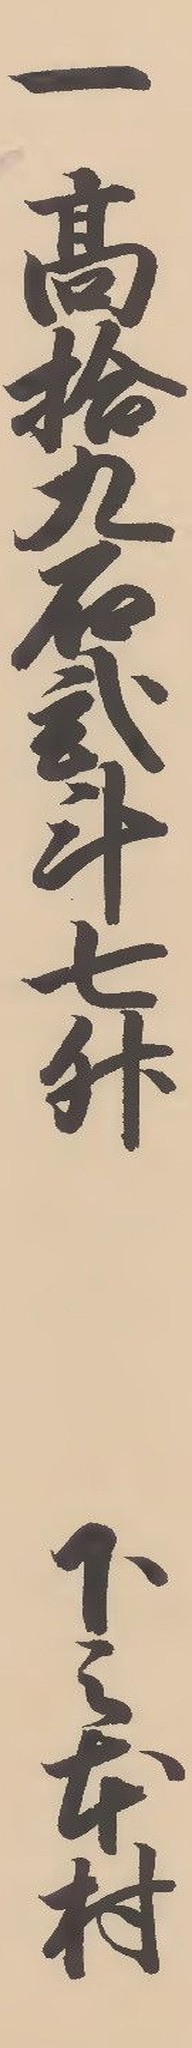一高拾九石弐斗七升下之本村
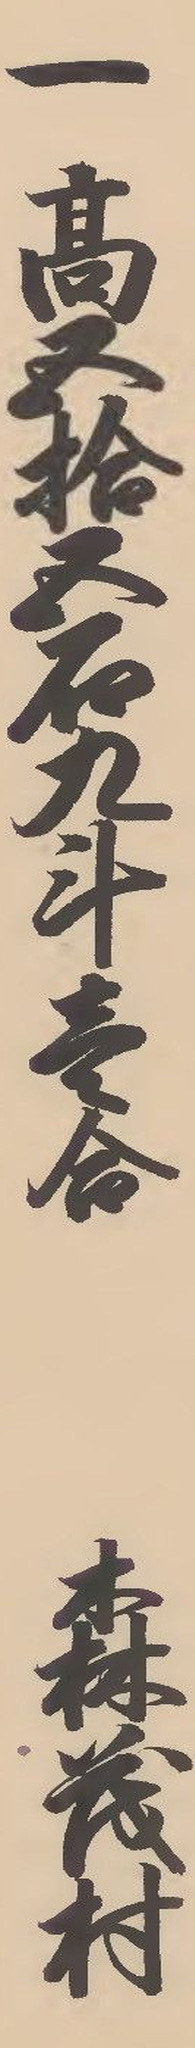一高五拾五石九斗壱合森茂村

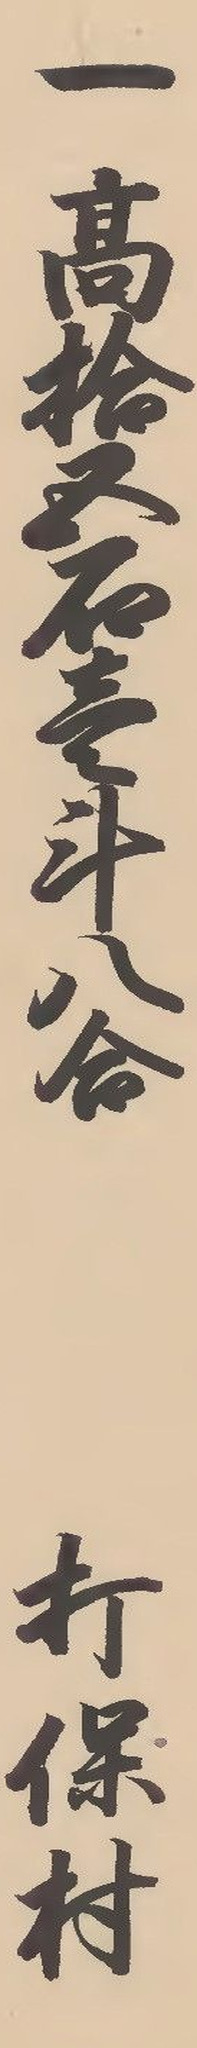一高拾五石壱斗八合打保村
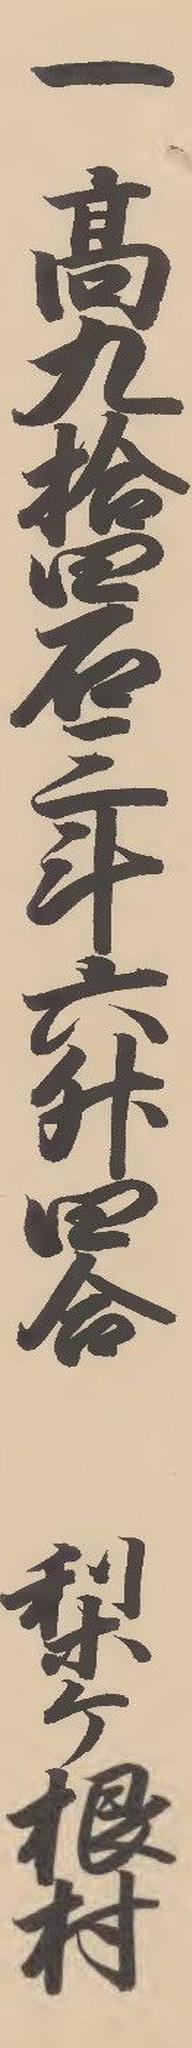一高九拾四石三斗六升四合梨ヶ根村
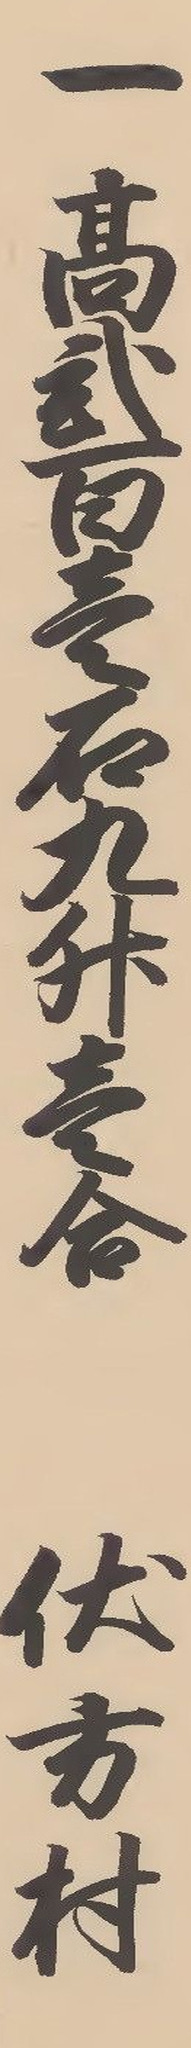一高弐百壱石九升壱合伏方村
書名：飛騨国郷帳
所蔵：国立公文書館 National Archives of Japan
